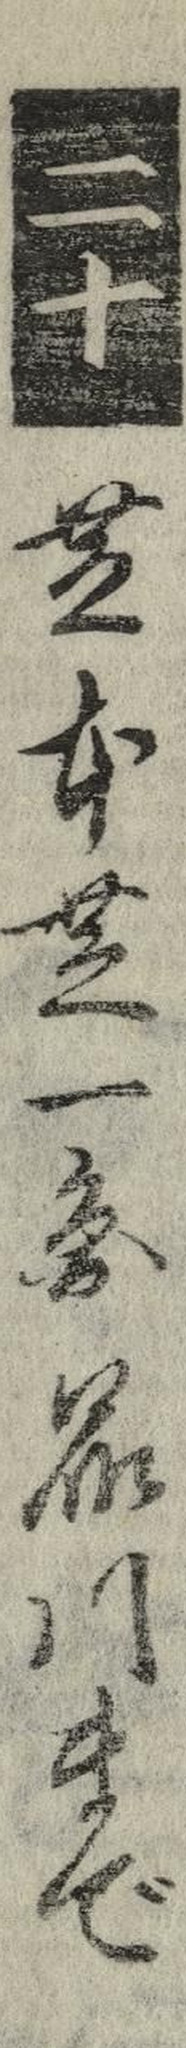二十芝本芝一円品川まで
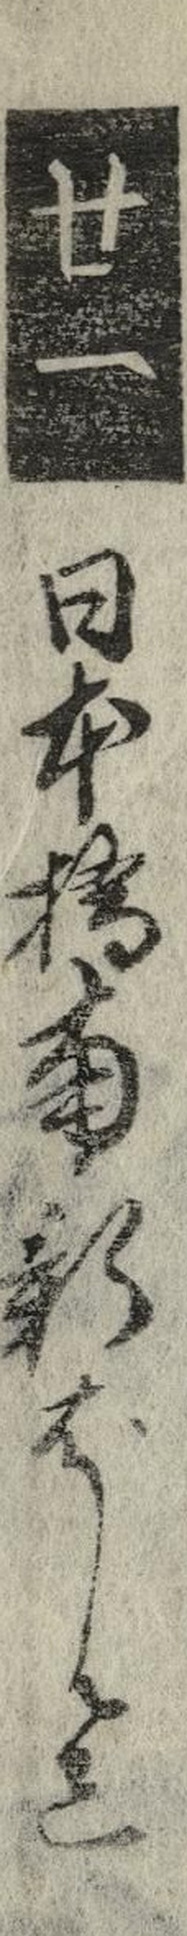廿一日本橋南新ばし迄
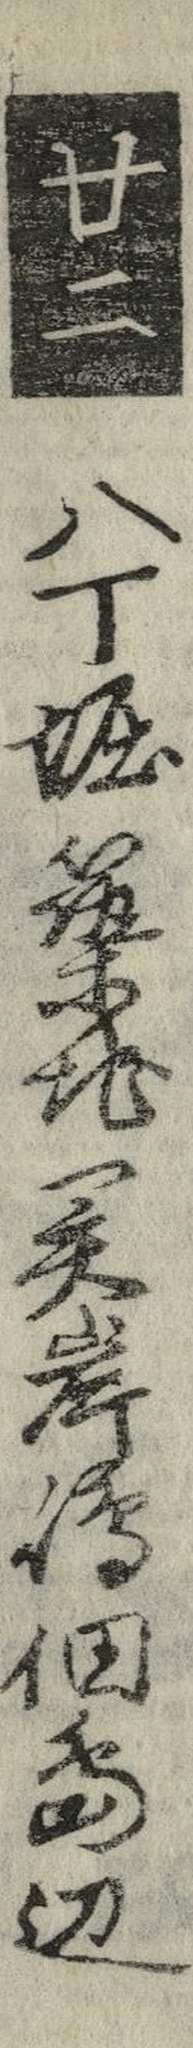廿二八丁堀築地霊岸島佃島辺
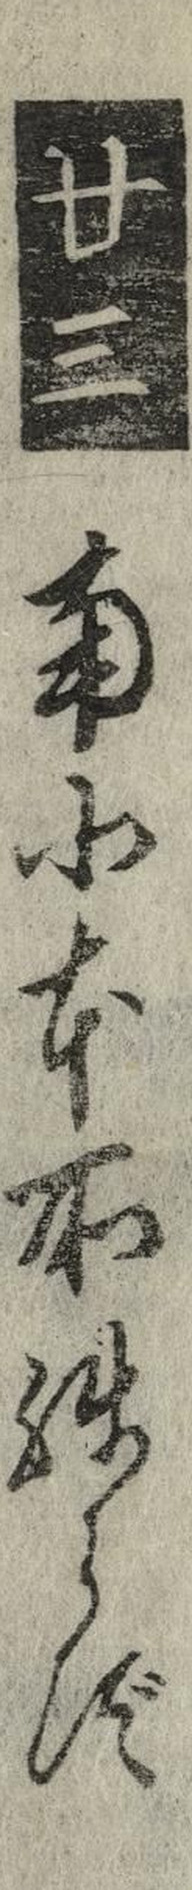廿三南北本所残らず
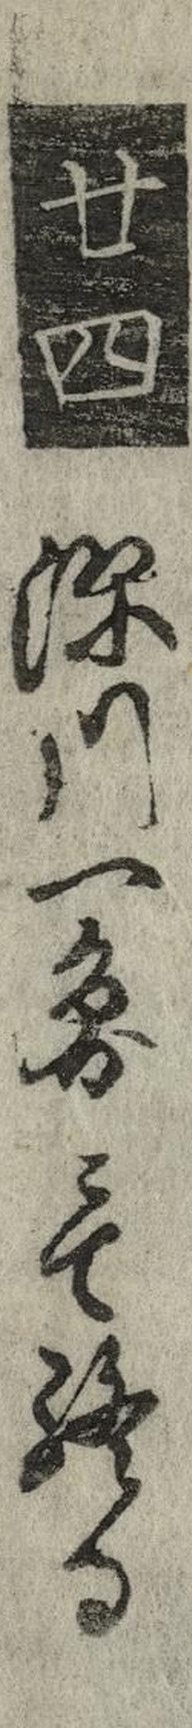廿四深川一円にて終る

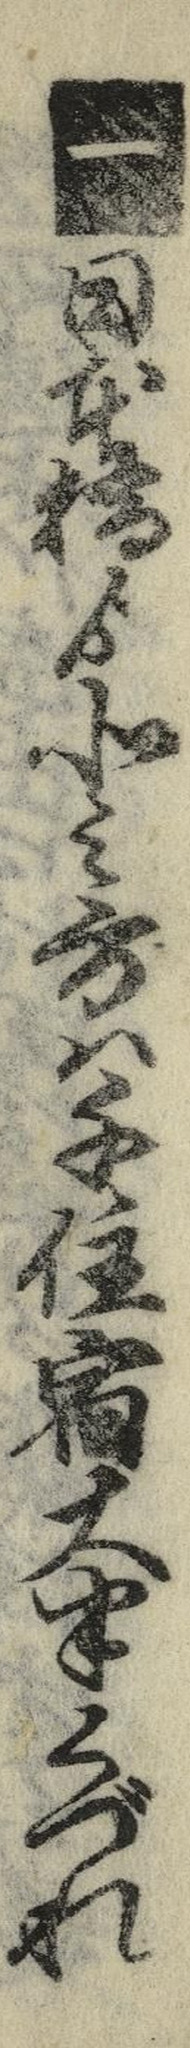一日本橋ゟ北の方は千住宿大半くづれ
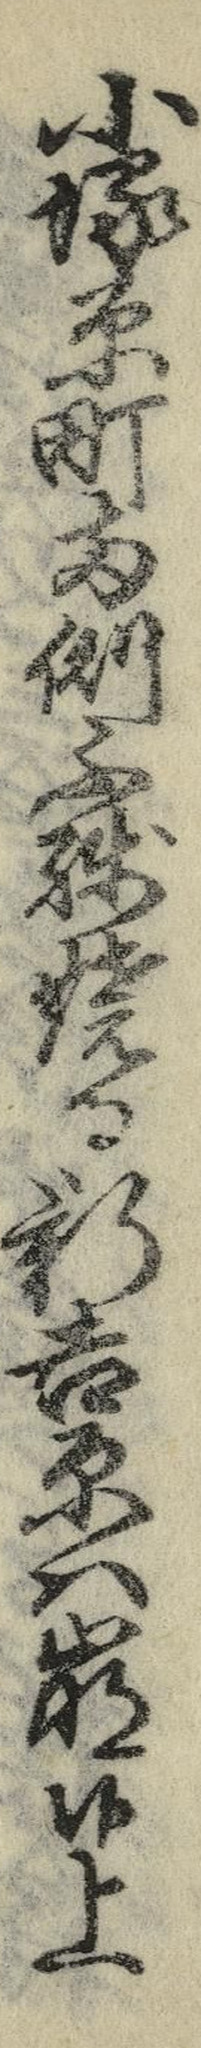小塚原町両側不残焼る新吉原は崩候上
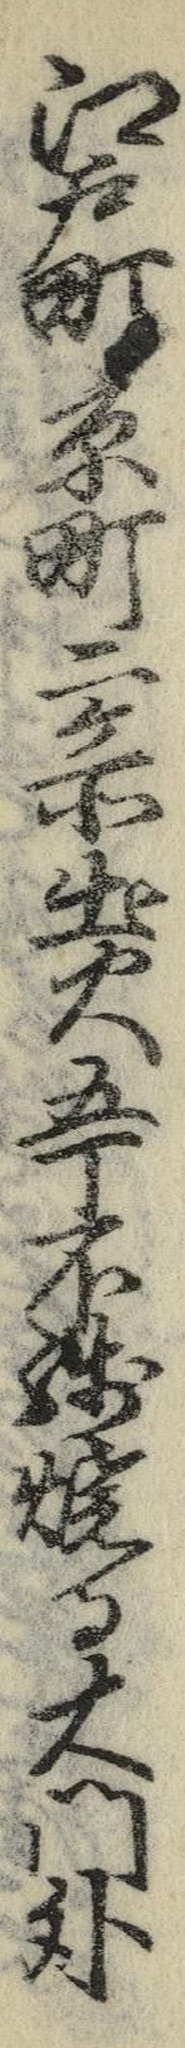江戸町京町二ヶ所出火五丁不残焼る大門外
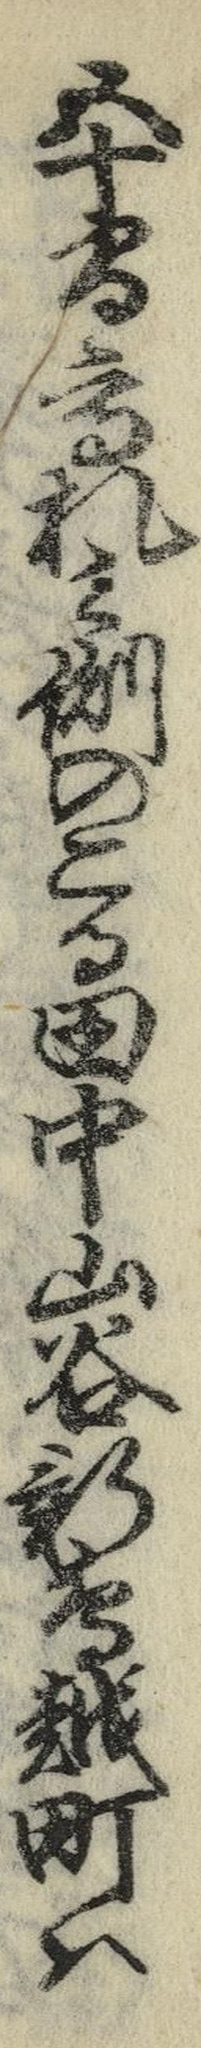五十間高礼之側のこる田中山谷新鳥越町は
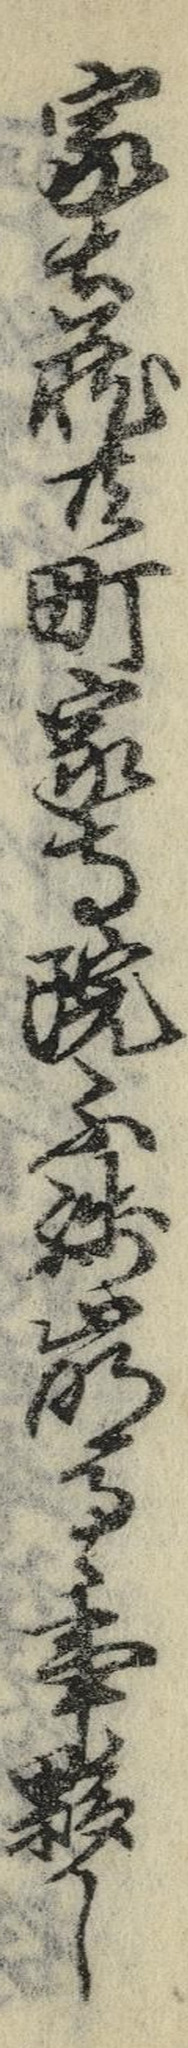家土蔵共町家寺院不残崩るヽ事夥し
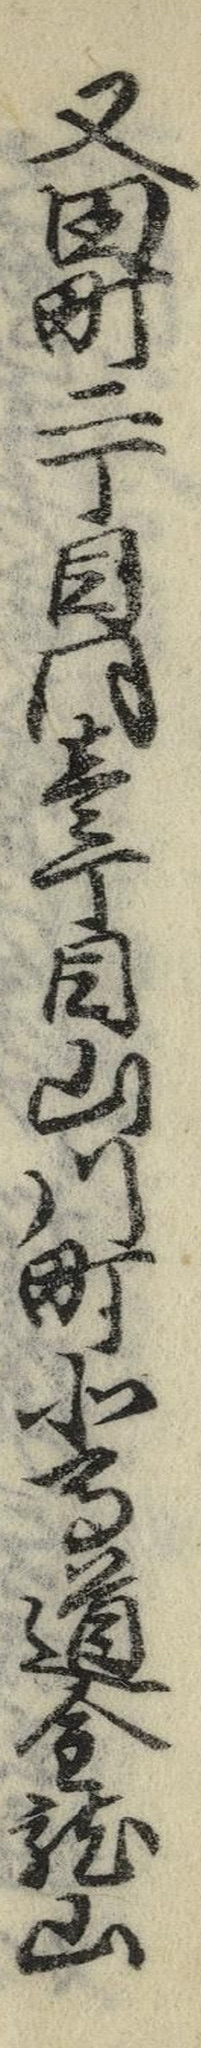又田町二丁目同壱丁目山川町北馬道金龍山
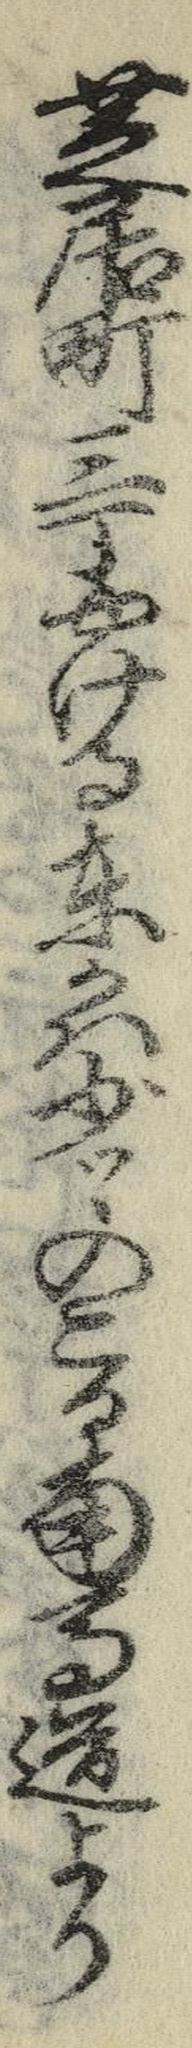芝居町三丁やける東かは少々のこる南馬道より
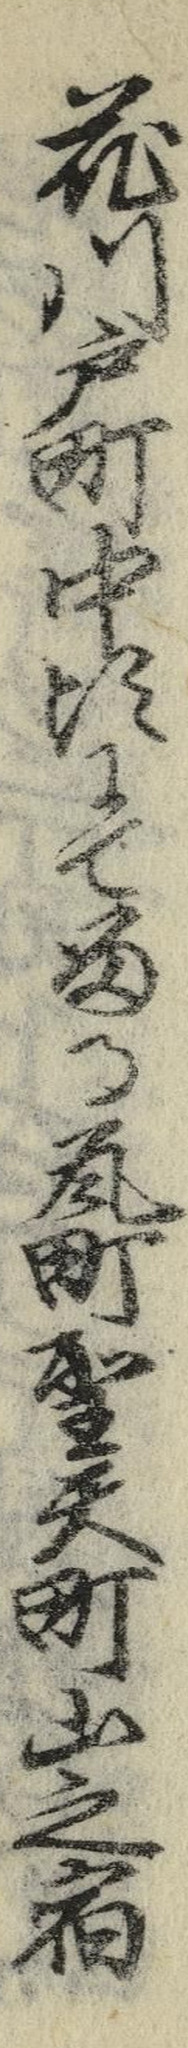花川戸町中頃にて留る瓦町聖天町山之宿
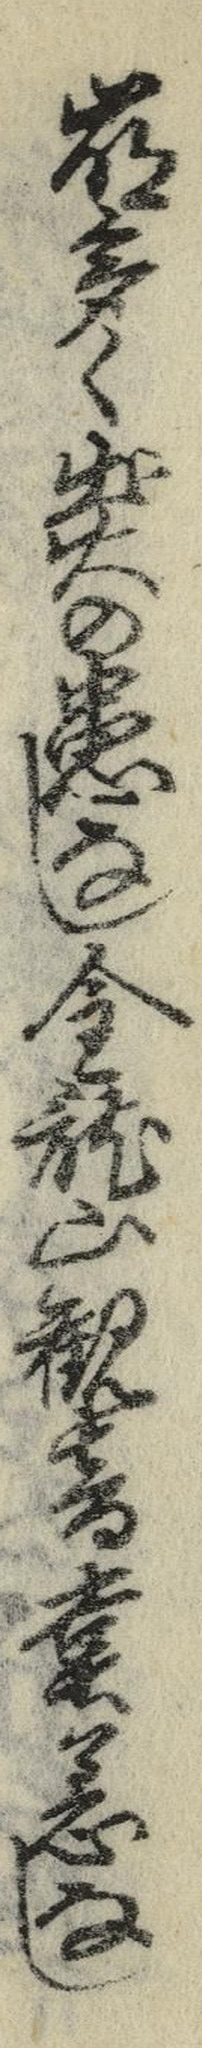崩多く出火の患なし金龍山観音堂恙なし
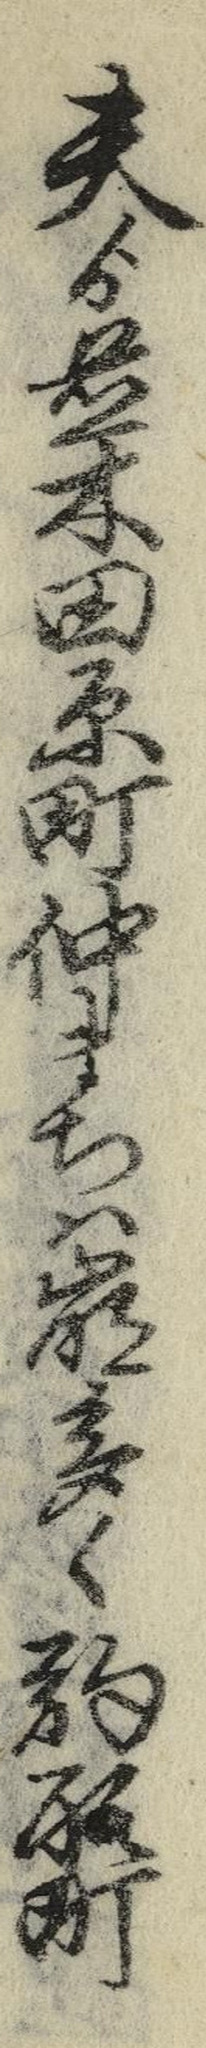夫ゟ並木田原町仲まちは崩多く駒形町
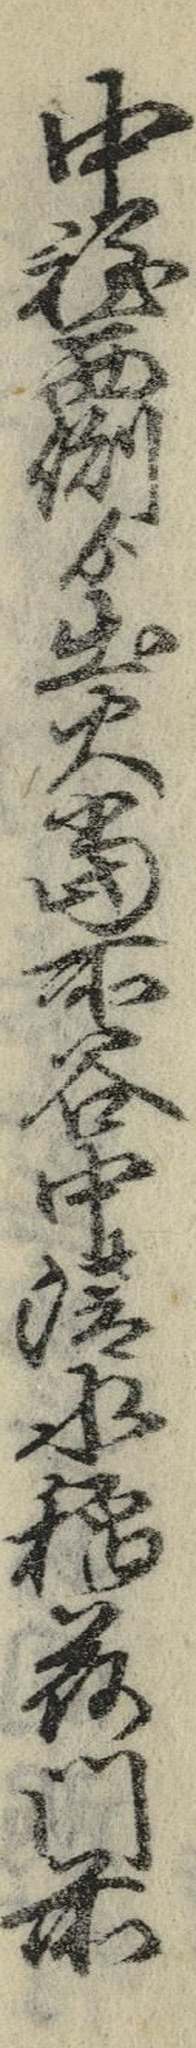中程西側ゟ出火当所谷中清水稲荷門前
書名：地震類焼場所明細書之写　安政二卯年十月二日夜四ツ時過　御府内御屋敷方市中共、并街道筋近郷聞書
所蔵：東京大学地震研究所図書室 Earthquake Research Institute Library, The University of Tokyo, JAPAN
